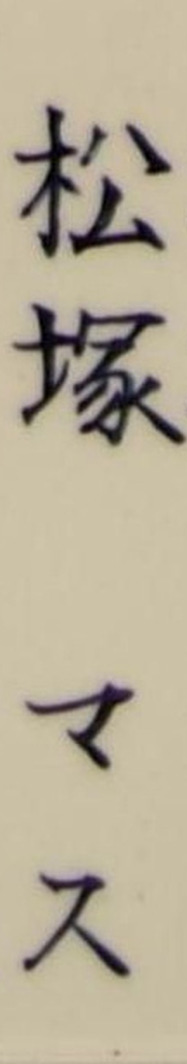松塚マス
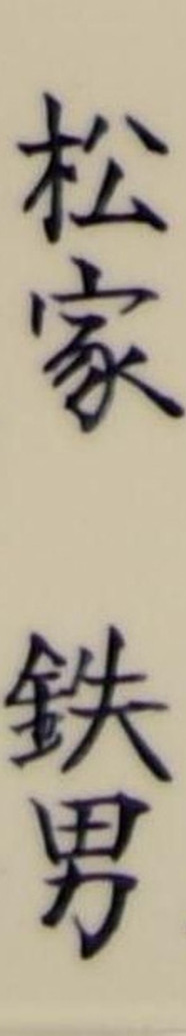松家鉄男
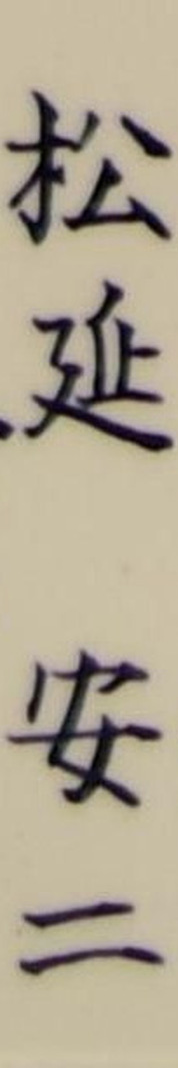松延安二
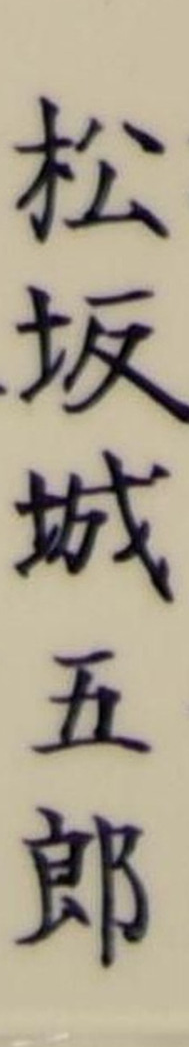松坂城五郎
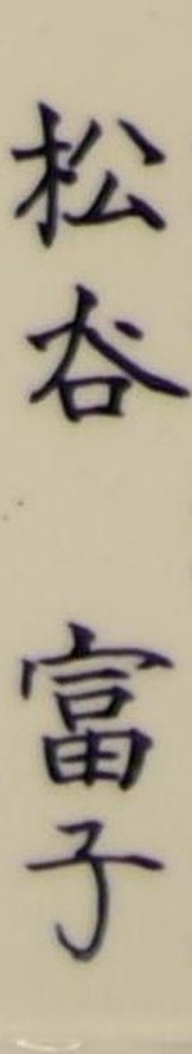松谷富子
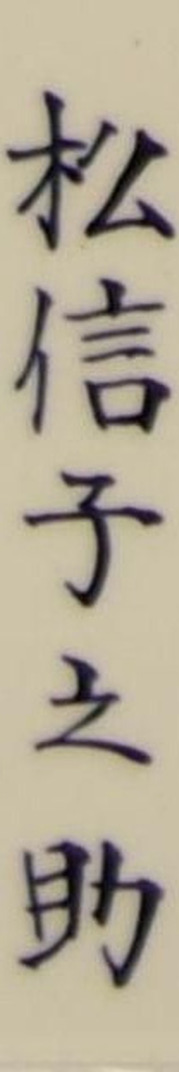松信子之助
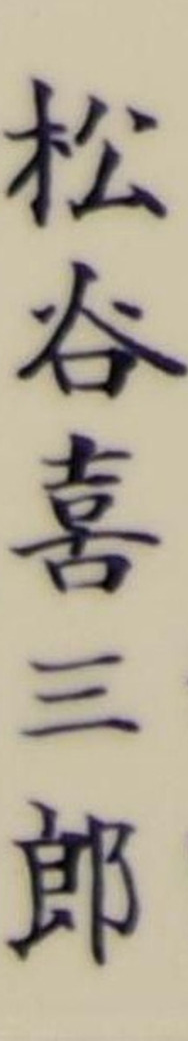松谷喜三郎
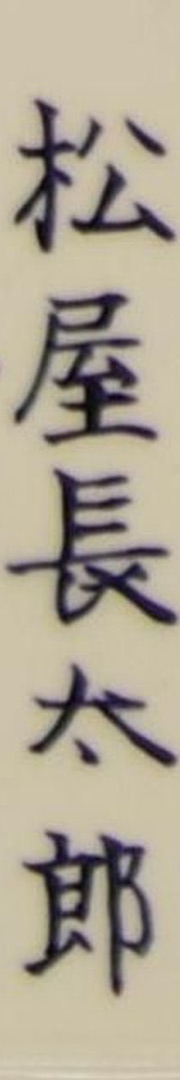松屋長太郎
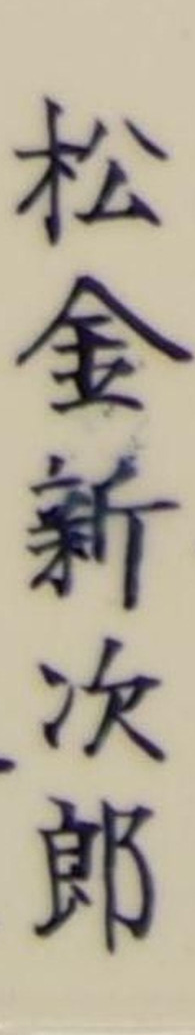松金新次郎
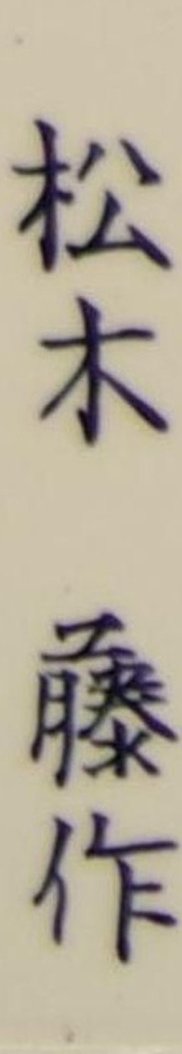松木藤作

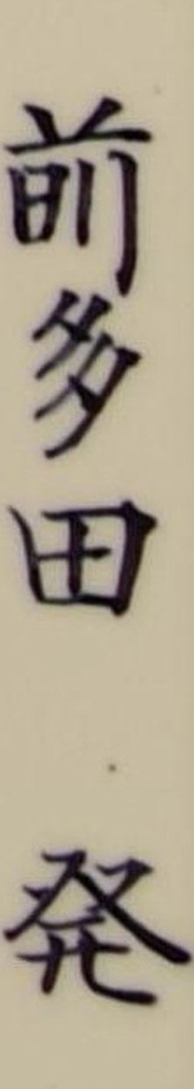前多田発
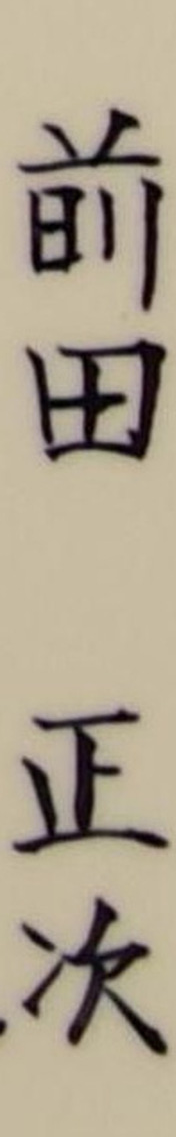前田正次
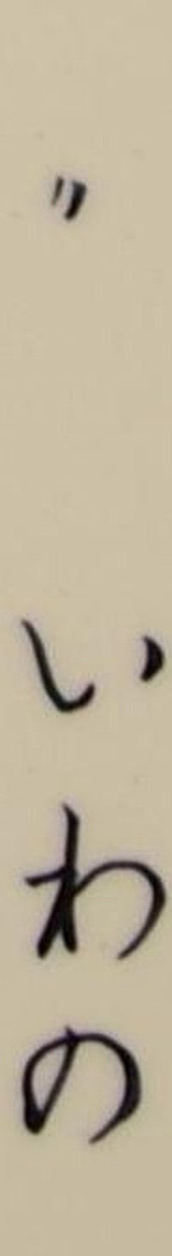いわの
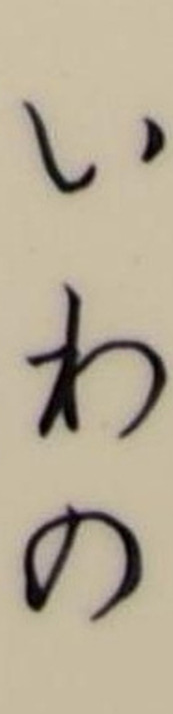いわの
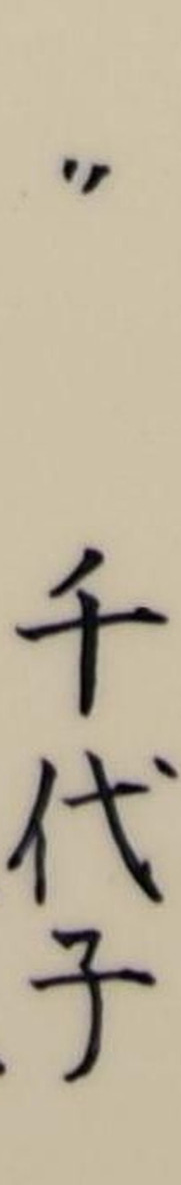千代子
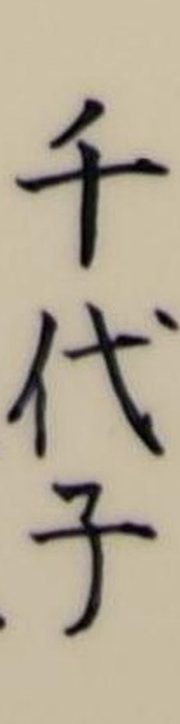千代子
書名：A~D
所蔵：koyasan kongobuji
